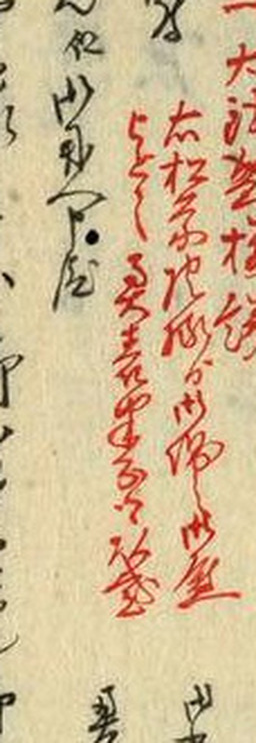被進之奥表半分ツヽ頂戴
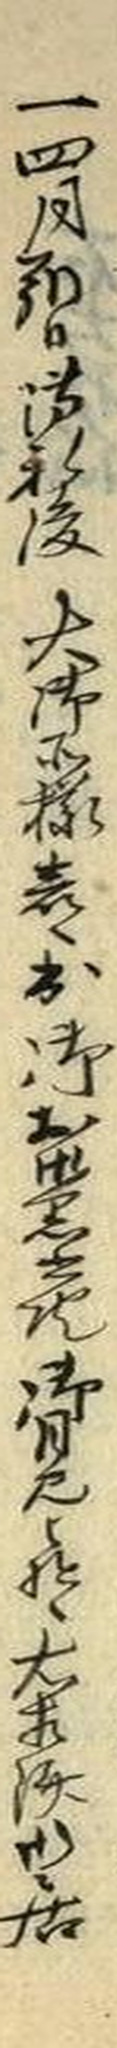一四月朔日御礼後大御所様表へ出御前於御黒書院御目見被遊候右相済御居
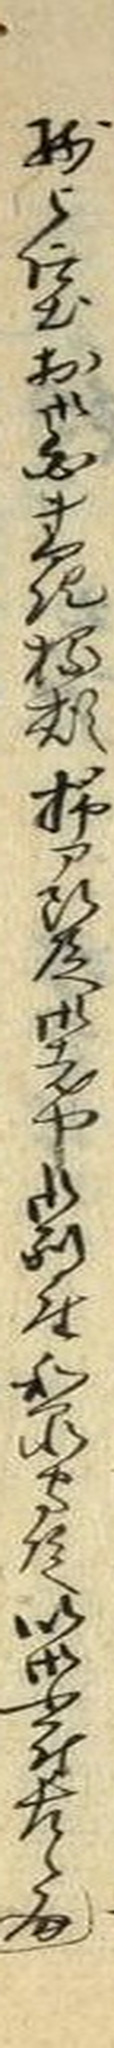残被仰出於御白書院縁頬掃部頭殿御老中御列座和泉守殿へ以御書付左之通
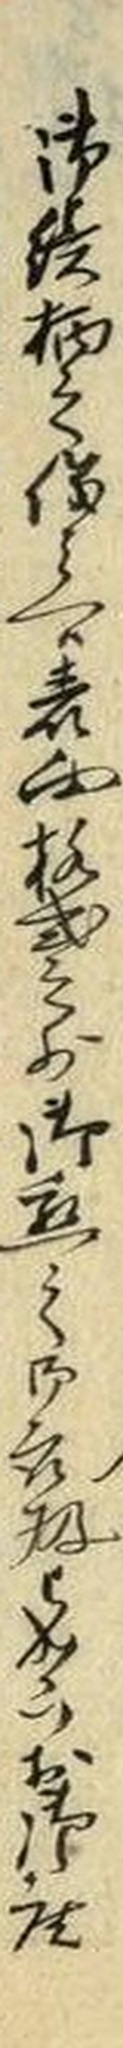御続柄之儀ニ候へハ表向格式之外御懇之御取扱被成下於御座
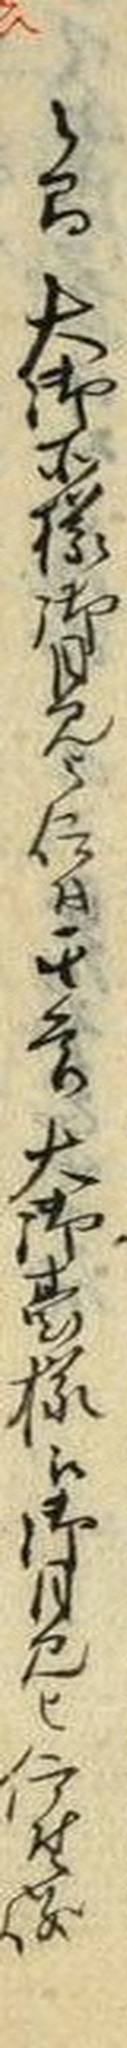之間大御所様御目見被仰付其節大御台様江御目見被仰付候儀
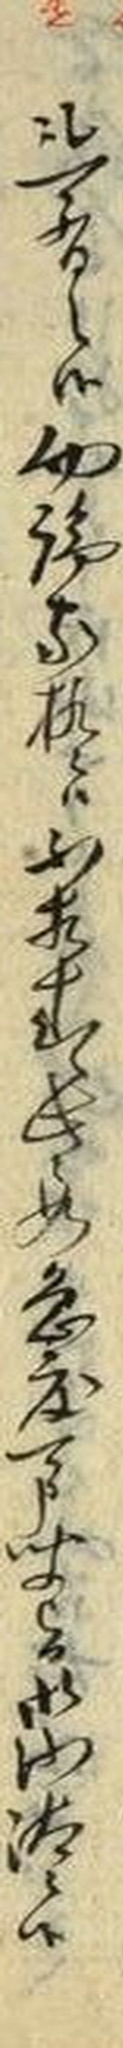も可有之候勿論家格ニハ不相成候此段急度可申聞旨御沙汰ニ候
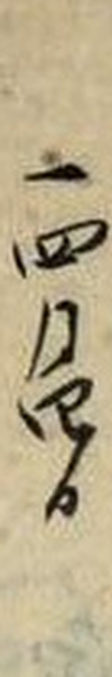一四月四日

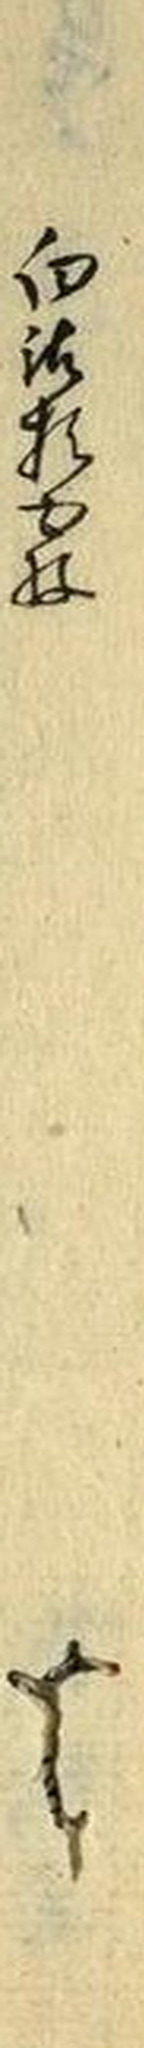白銀拾五枚
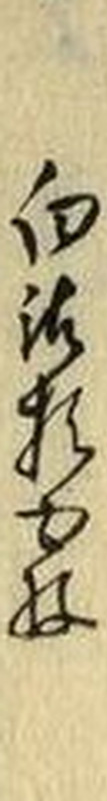白銀拾五枚
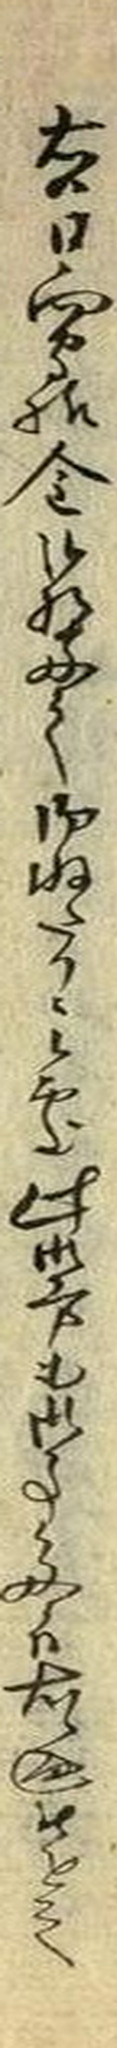右ハ日向守様金弐拾両之御ねたりニ候処此御方も御事多ニ付右之通被進之
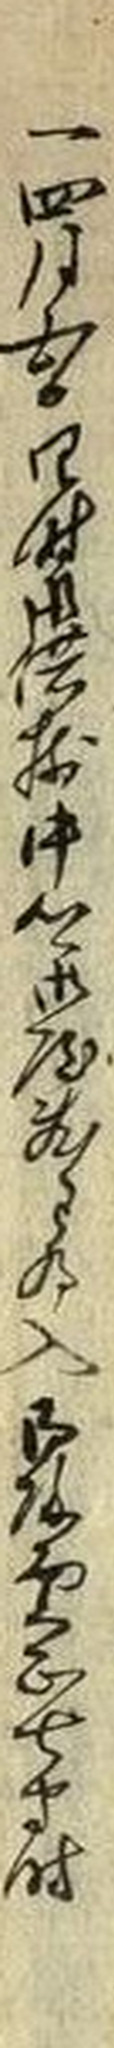一四月五日四時御供揃中郷御屋敷被為入御帰殿正七半時
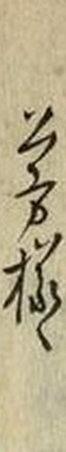公方様へ
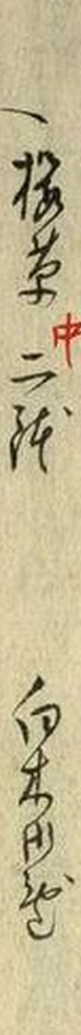桜草中二鉢白木御台
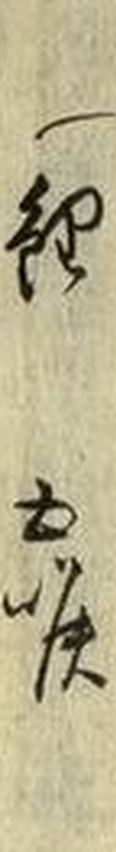鯉二喉
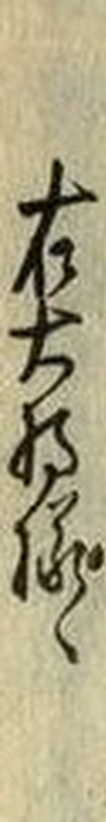右大将様へ
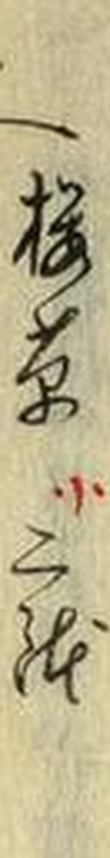桜草二鉢
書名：少傅日録抄（斉善付側向頭取日記、江戸并道中、初入在国、逝去後…
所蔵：福井県文書館 Fukui Prefectural Archives
